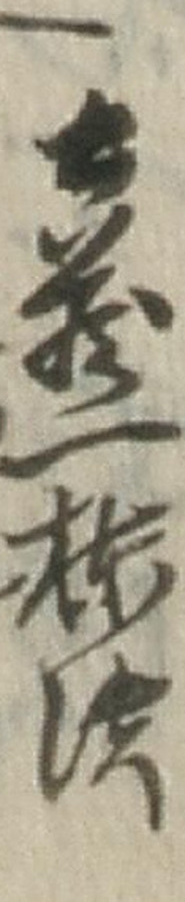長屋一棟潰
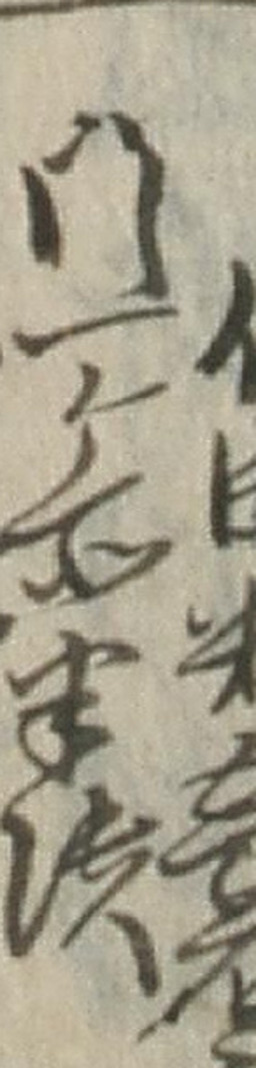門一ヶ所半潰
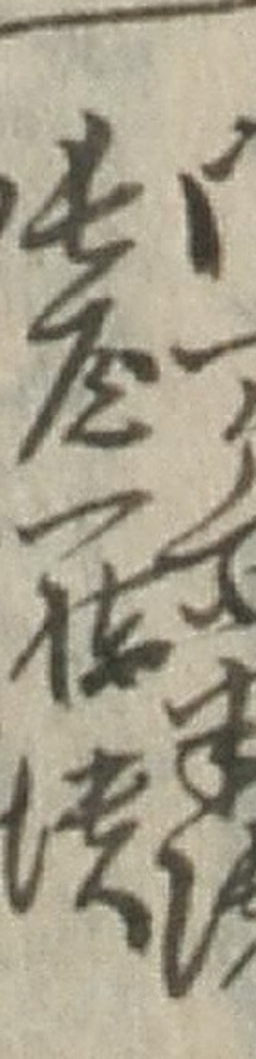長屋一棟潰
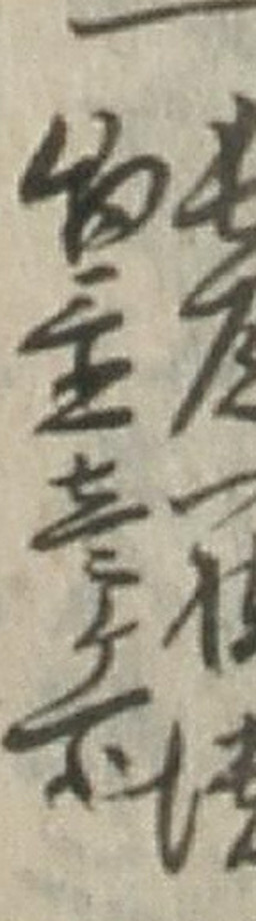物置壱ヶ所
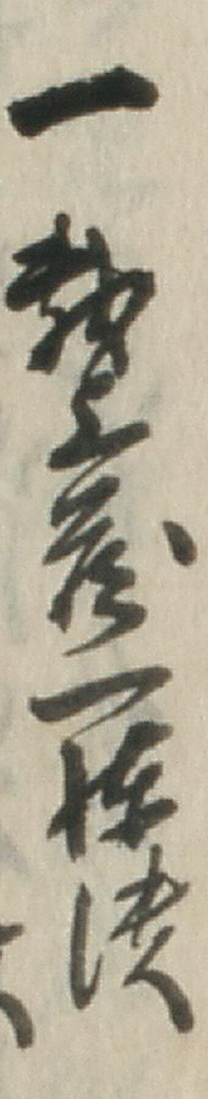一献上蔵一棟潰
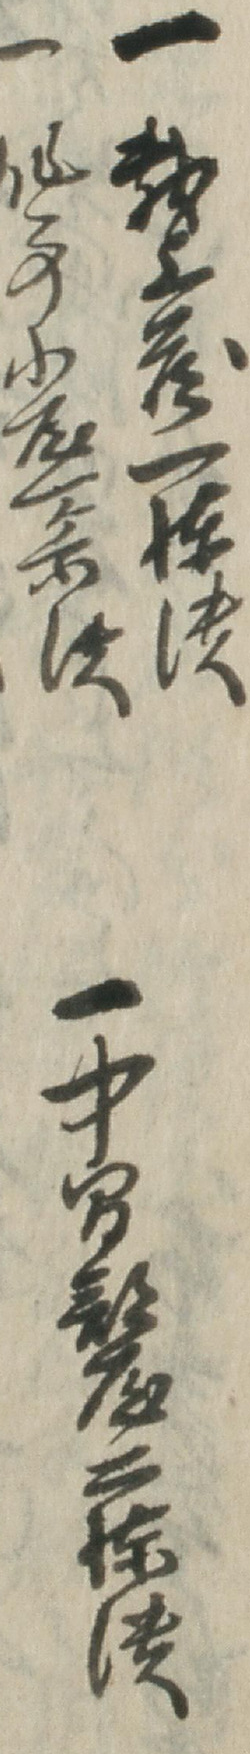一作事小屋一ヶ所潰一中間部屋二棟潰
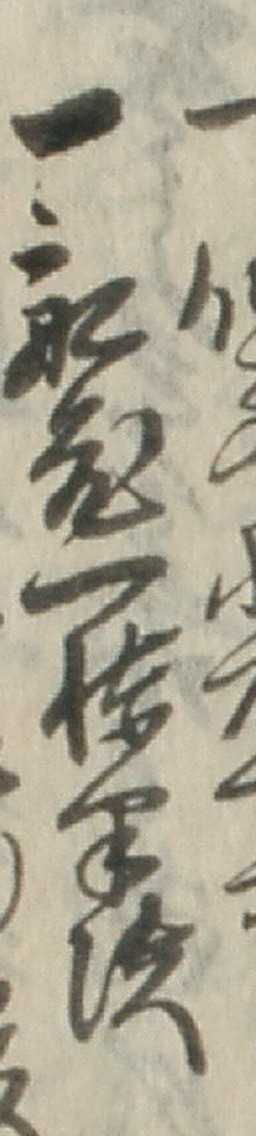一船蔵一棟半潰
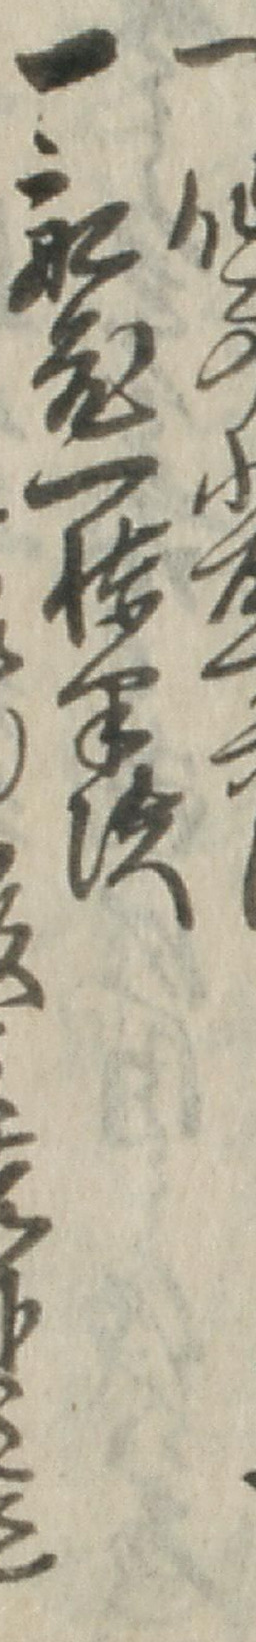一船蔵一棟半潰
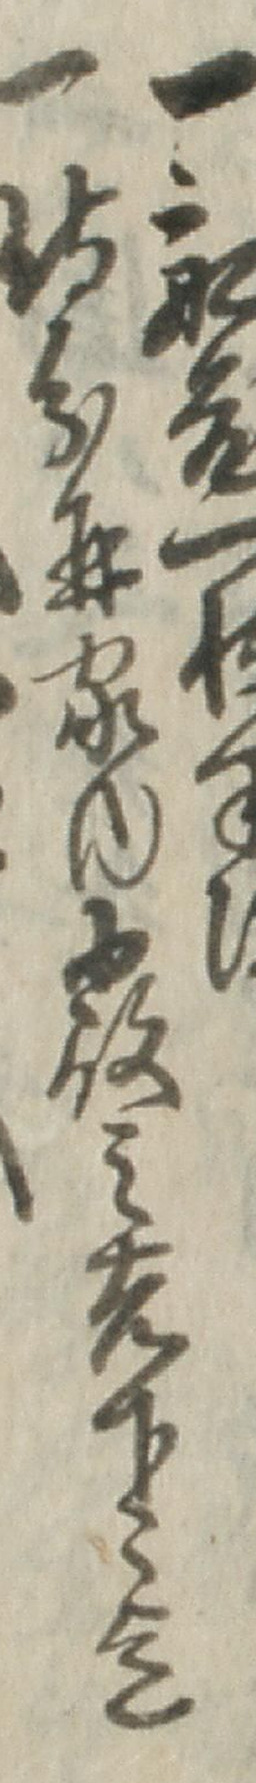一侍分并家内小役之者下々迄
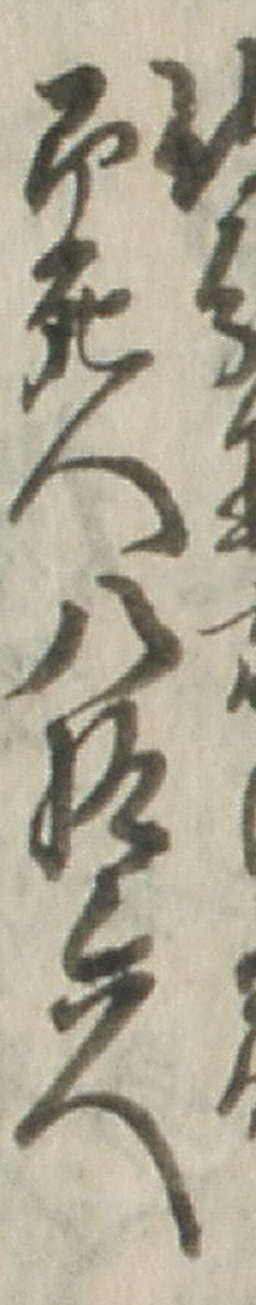即死人八拾三人
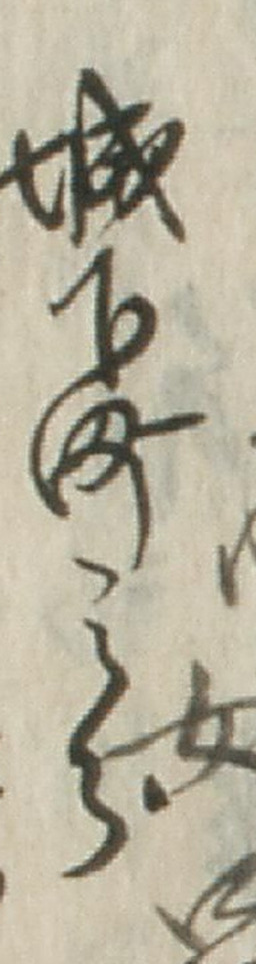城下町之分
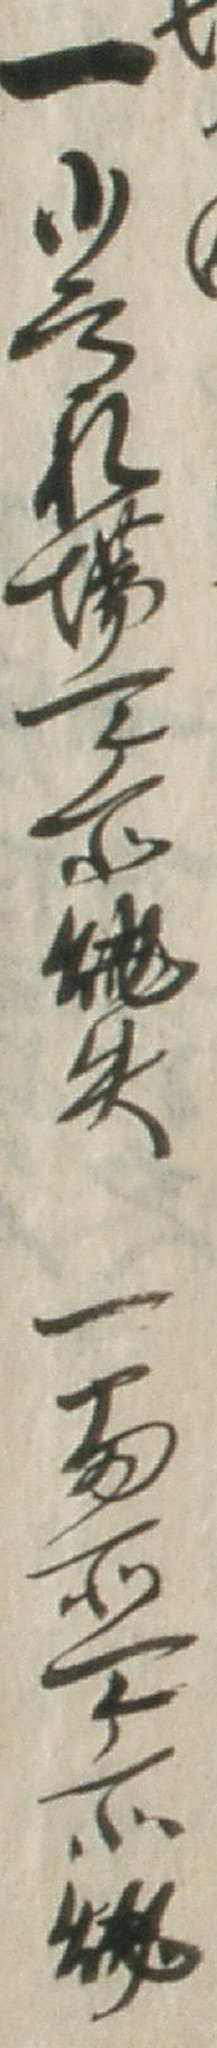一御高札場一ヶ所焼失一番所一ヶ所焼
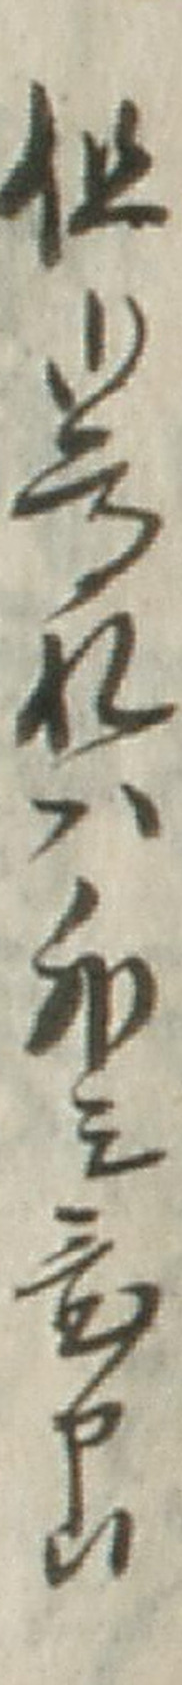但御高札ハ外ㇱ置申候
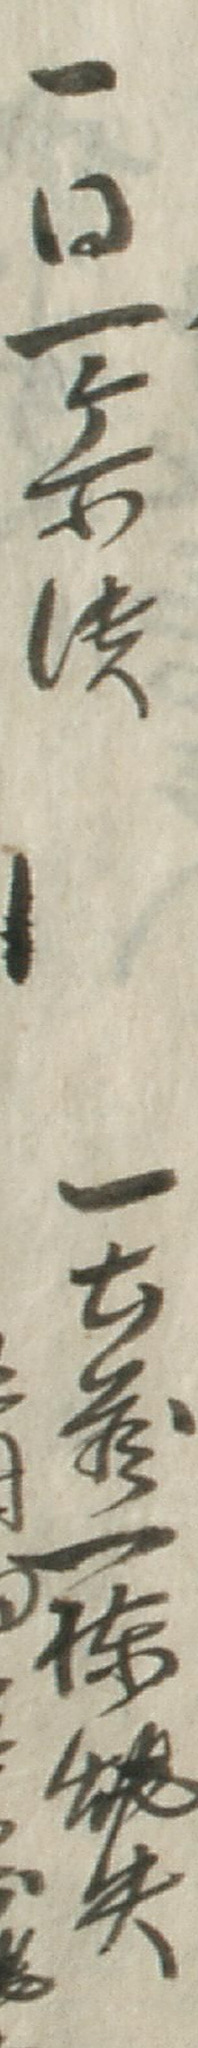一同一ヶ所潰一土蔵一棟焼失
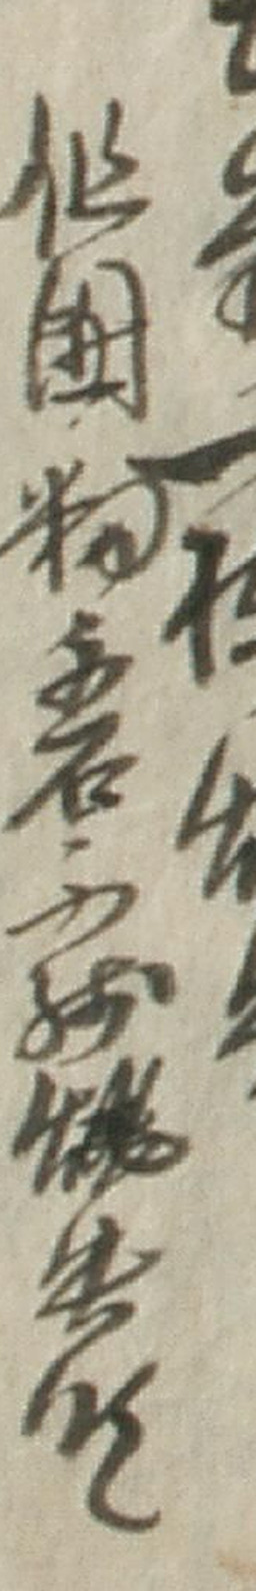但囲籾千石不残焼失候
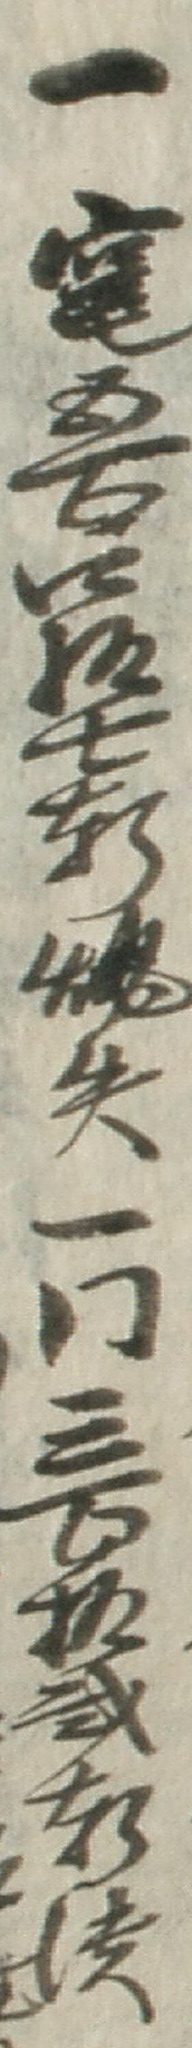一竃五百四拾七軒焼失一同三百拾弐軒潰
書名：信濃國地震實録記
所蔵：東京大学地震研究所図書室 Earthquake Research Institute Library, The University of Tokyo, JAPAN
